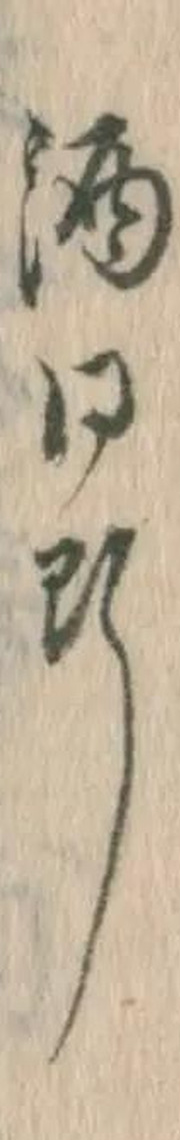酒同断
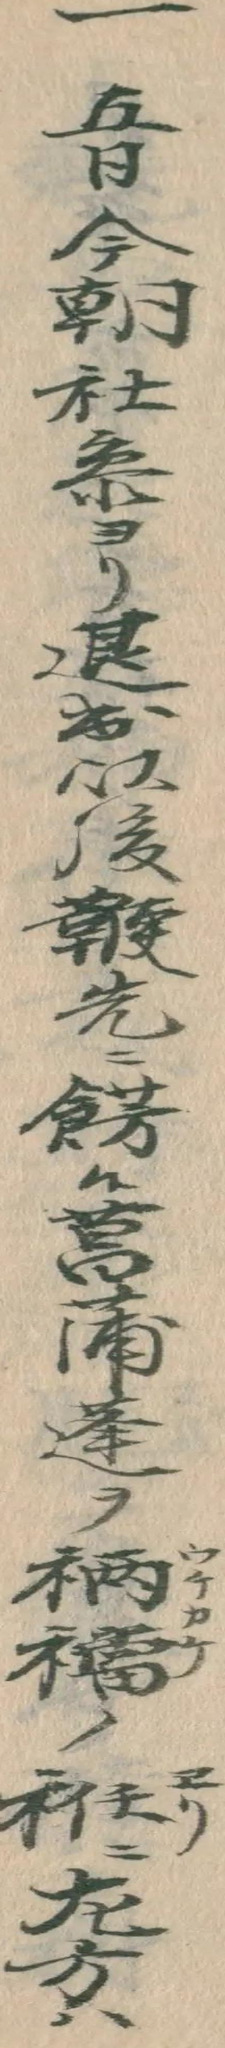一五日今朝社参ヨリ退出以後鞭先ニ餝候菖蒲蓬ヲ裲襠ノ袵ニ左方ハ
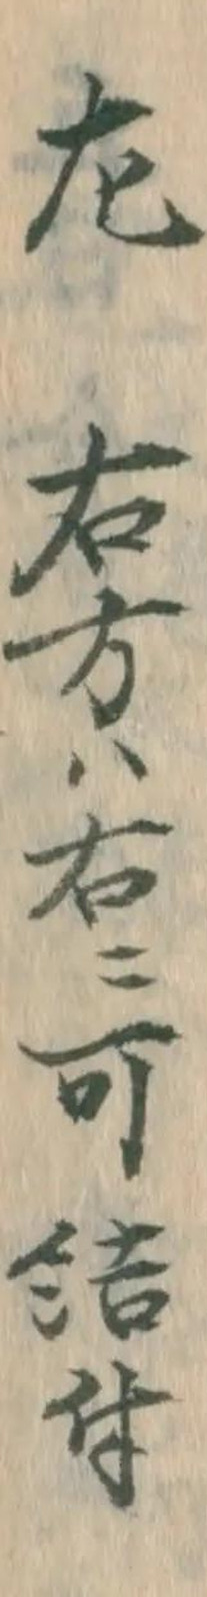左右方ハ右ニテ可結付

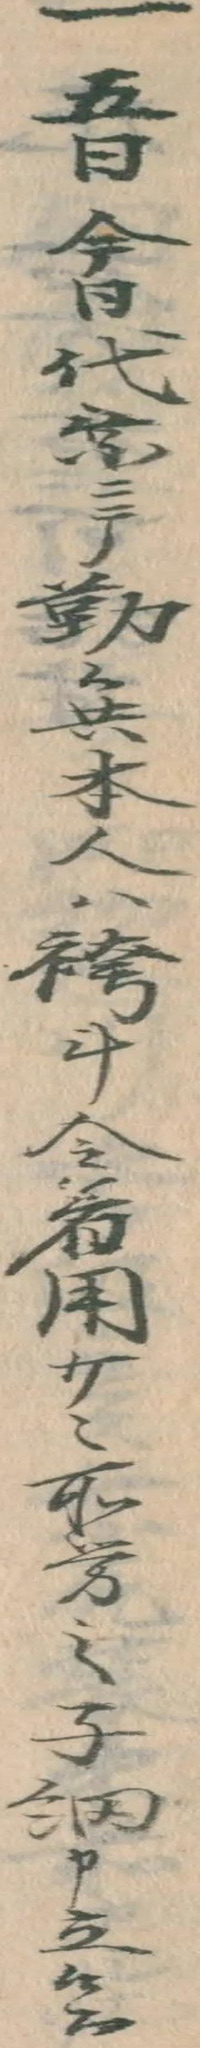一五日今日代乗ニテ勤候共本人ハ袴計令着用少々所労之子細申立候而
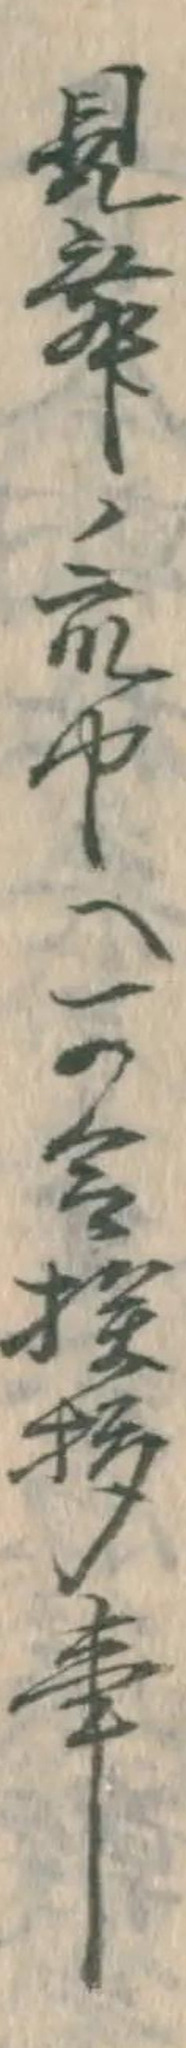見舞ノ衆中へ可令挨拶事
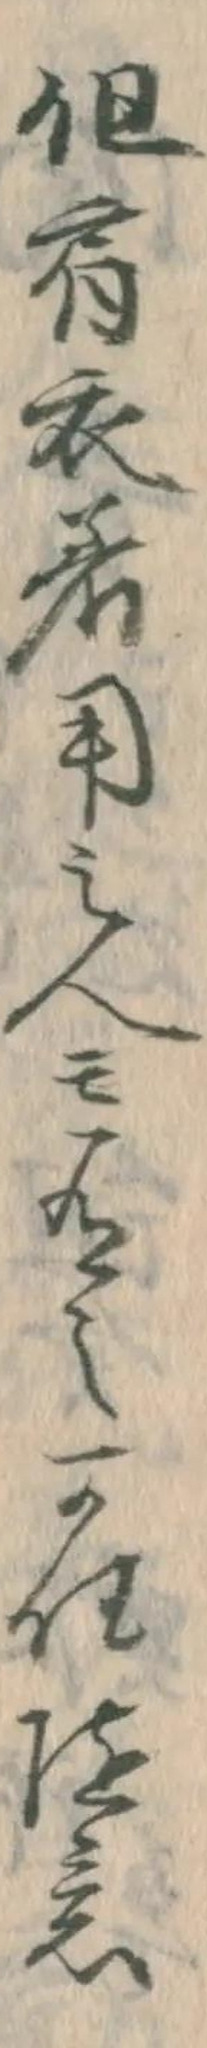但肩衣着用之人モ有之可任随意
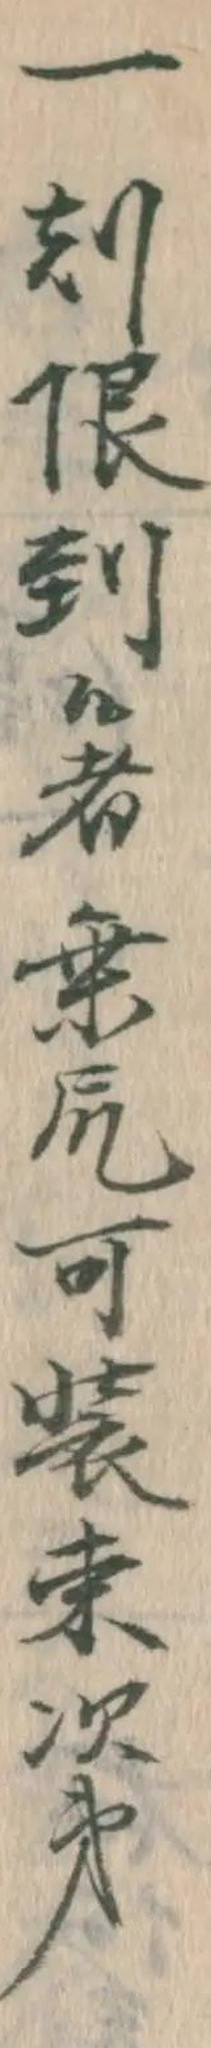一刻限到候者乗尻可装束次第
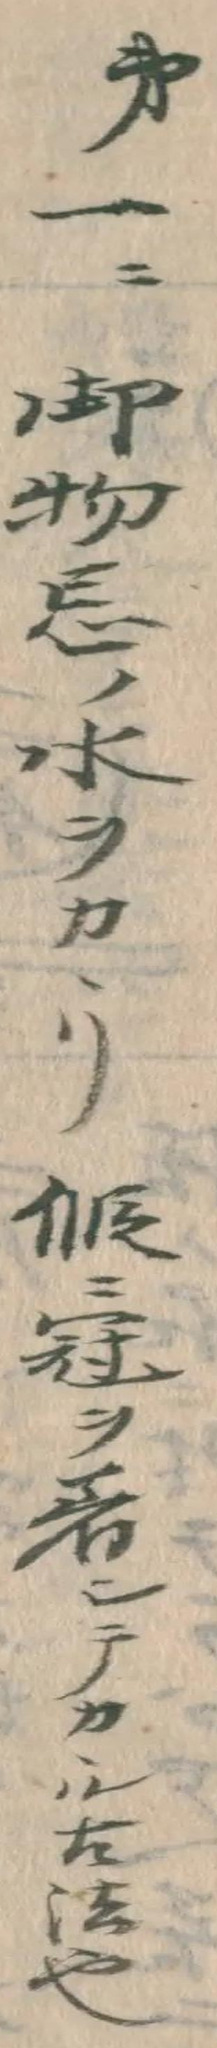第一ニ御物忌ノ水ヲカヽリ仮ニ冠ヲ着シテカヽル左法也
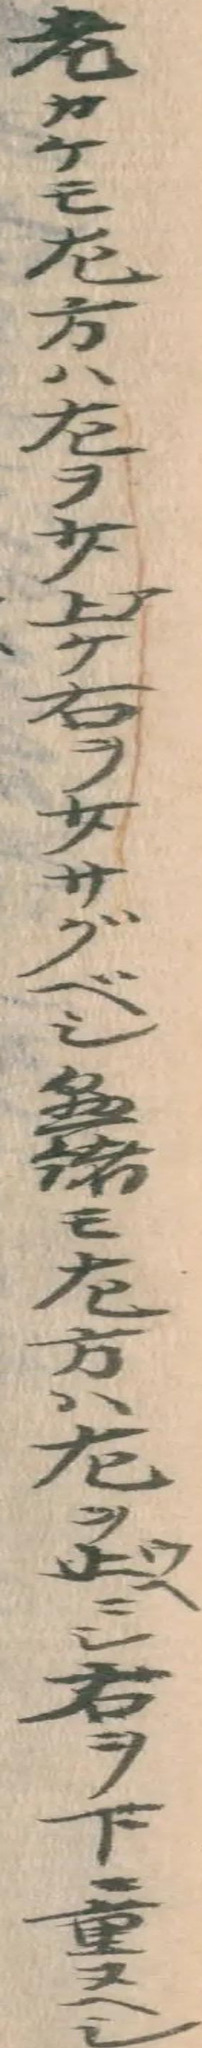老カケモ左方ハ左ヲ少上ケ右ヲ少サグベシ懸緒モ左方ハ左方ヲ上ニシ右ヲ下ニ重ヌヘシ
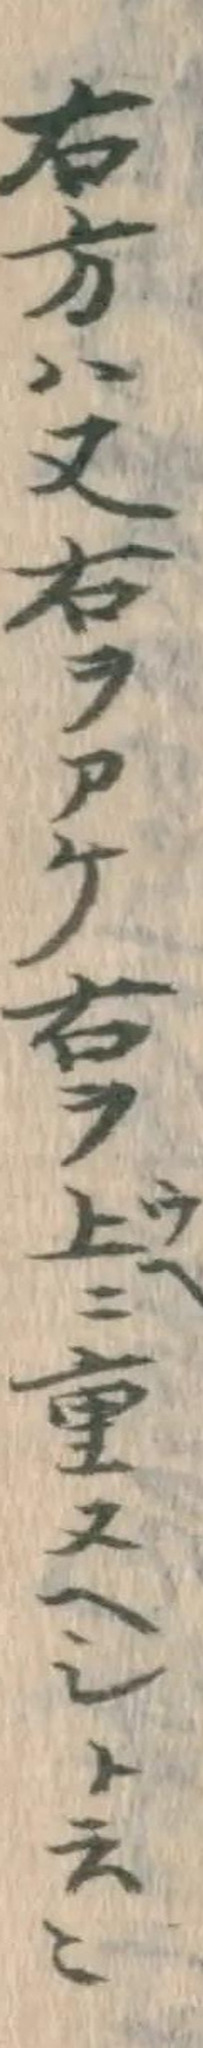右方ハ又右ヲアケ右ヲ上ニ重ヌヘシト云々
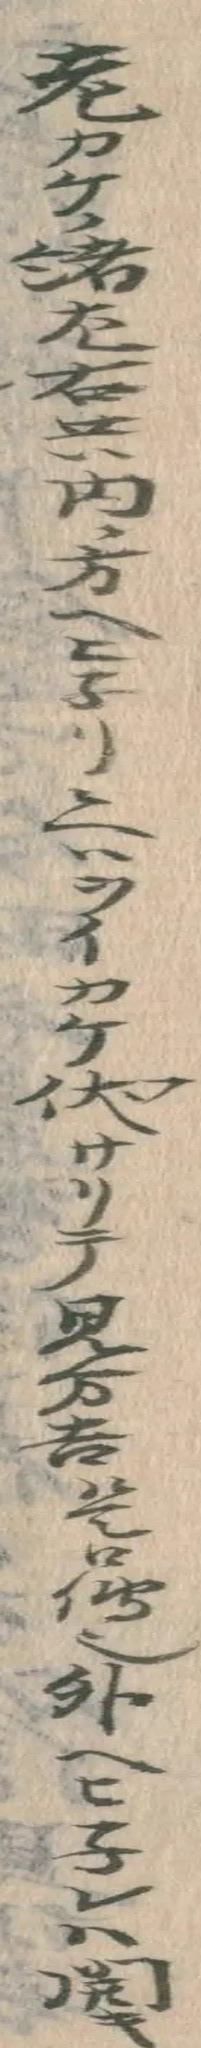老カケノ緒左右共内ノ方へヒネリ候ヘハヲイカケ伏サリテ見方吉是口伝也外へヒネレハ開キテ見苦敷也
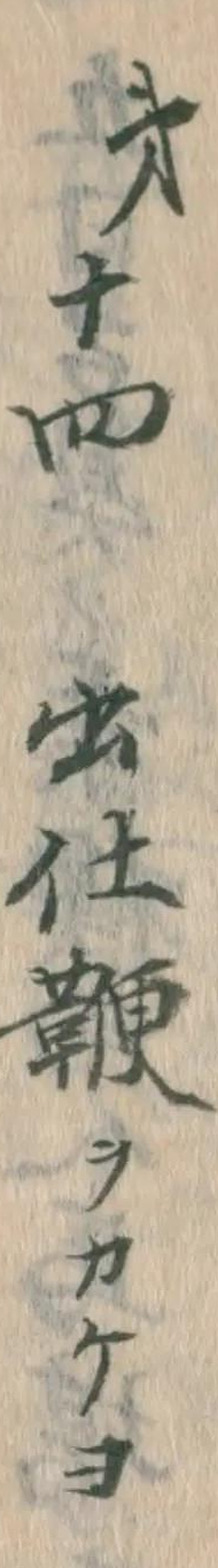第十四出仕鞭ヲカケヨ
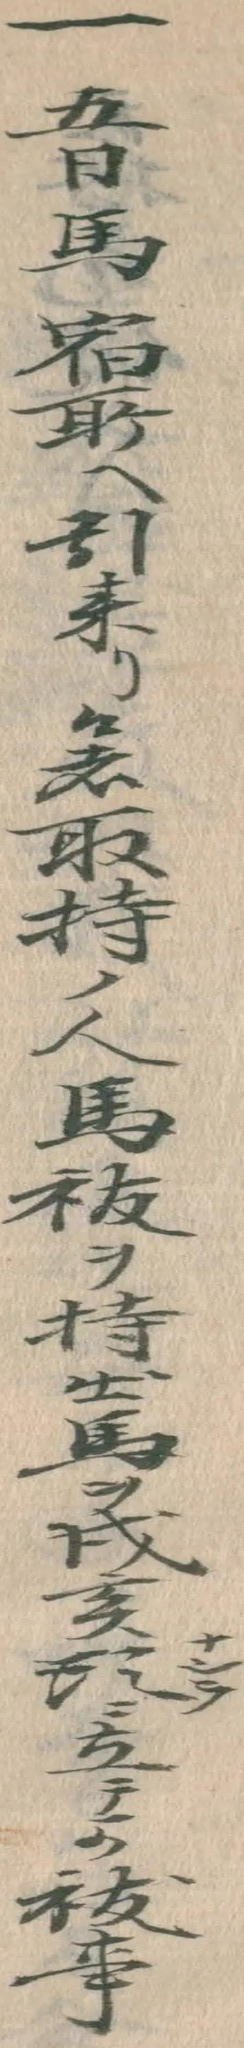一五日馬宿所へ引来リ候者取持ノ人馬祓ヲ持出馬ヲ戌亥頭ニ立テ可祓事
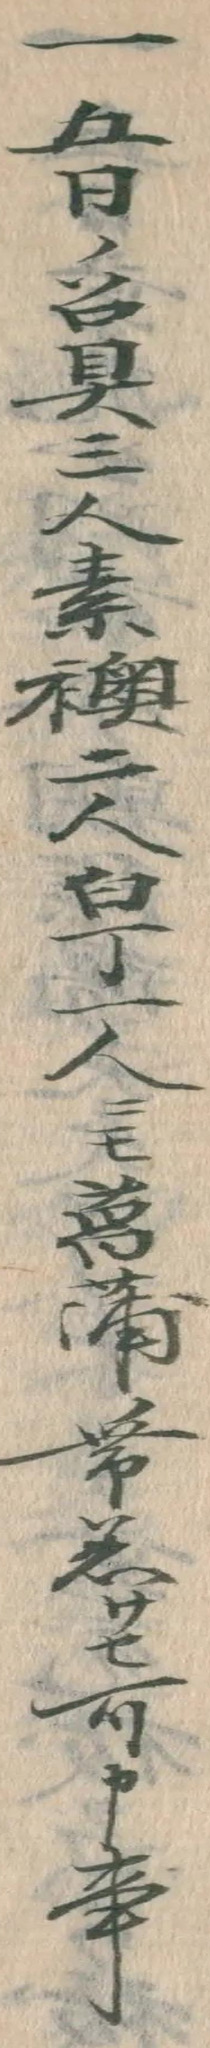一五日ノ召具三人素襖二人白丁一人ニモ菖蒲ノ帯着サセ可申事
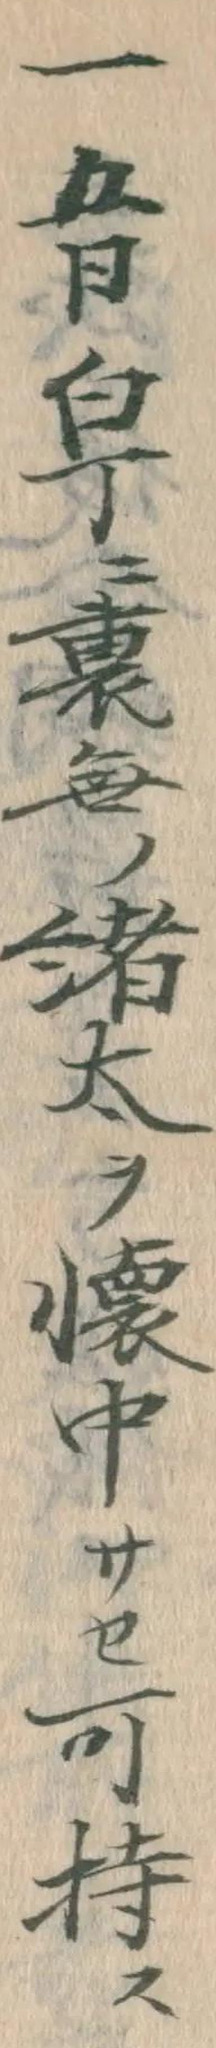一五日白丁ニ裏無ノ緒太ヲ懐中サセ可持ス
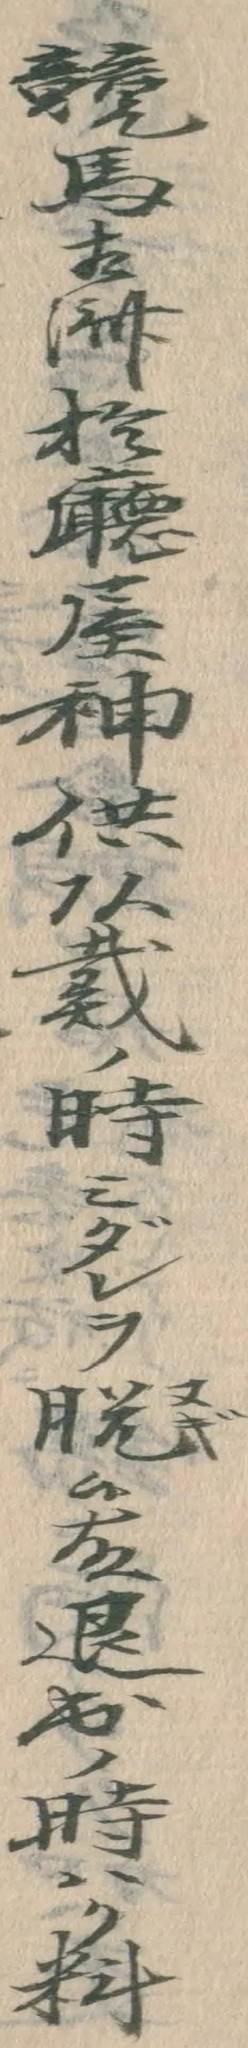競馬相済於庁屋神供頂戴ノ時ミダレヲ脱候故退出ノ時ハク料
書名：賀茂社記録. 第11冊
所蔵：国立国会図書館 National Diet Library, JAPAN
